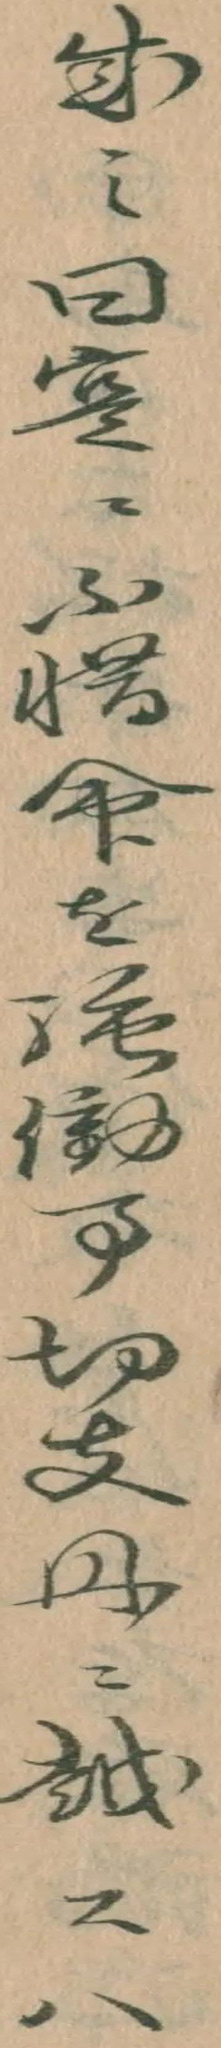成之曰寔にふ惜命を活働事切支丹に越すは
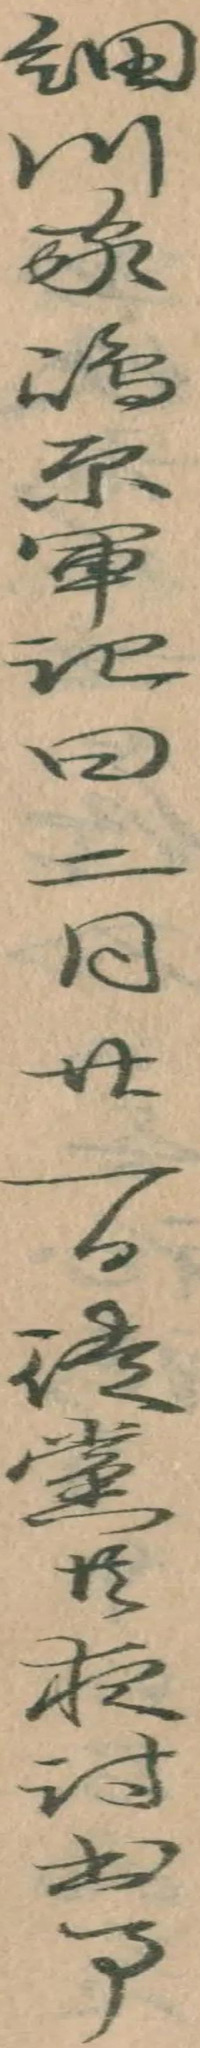細川家嶋原軍記曰二月廿一日徒党共夜討出事
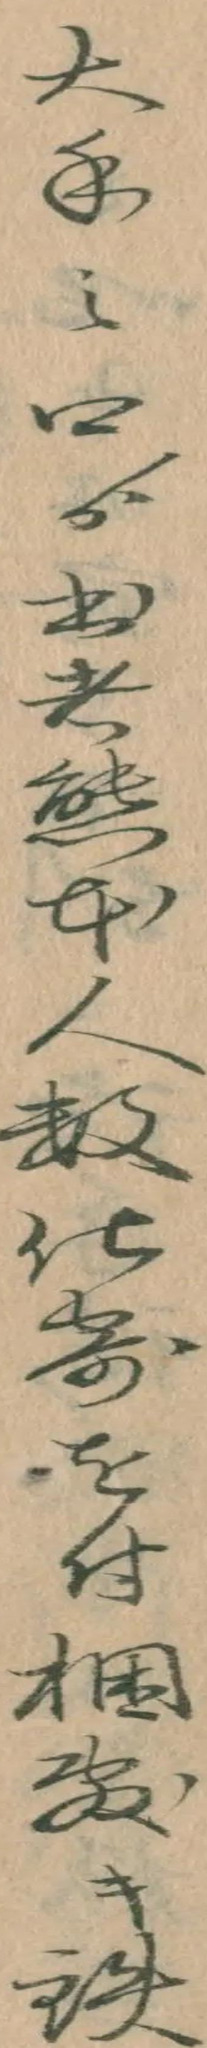大手之口ゟ出者熊本人数仕寄を付梱敷き鉄
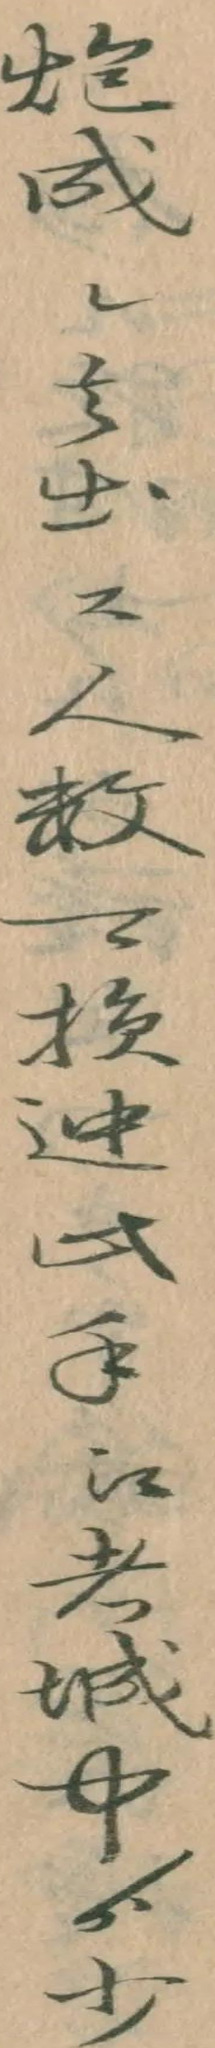炮成し其出す人数可損迚此手江者城中ゟ少
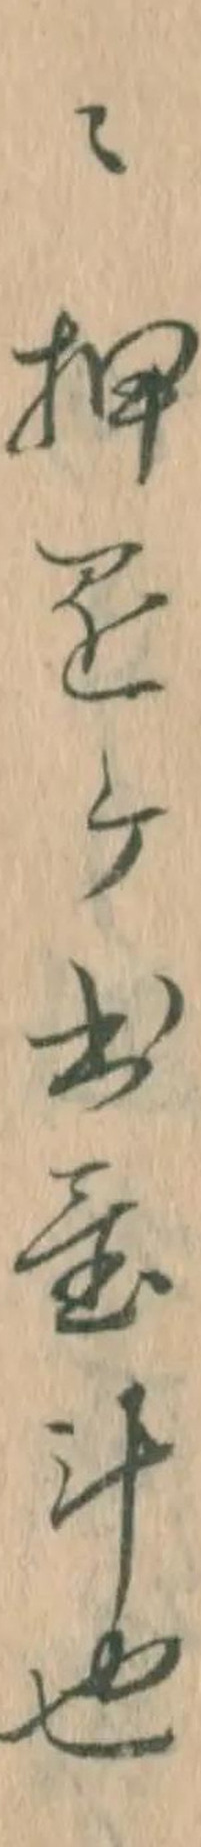に押懸け出置斗也
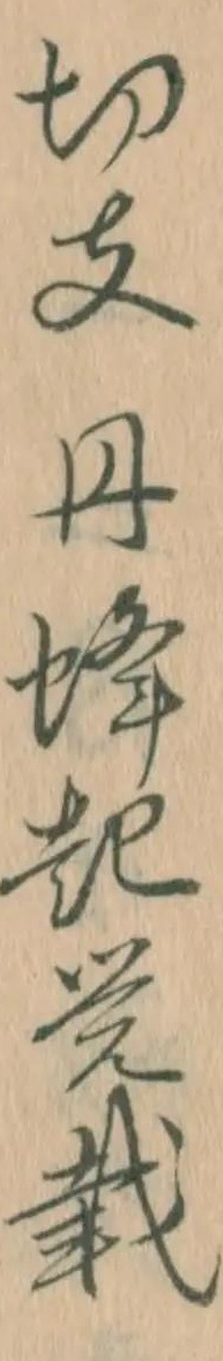切支丹蜂起覚載

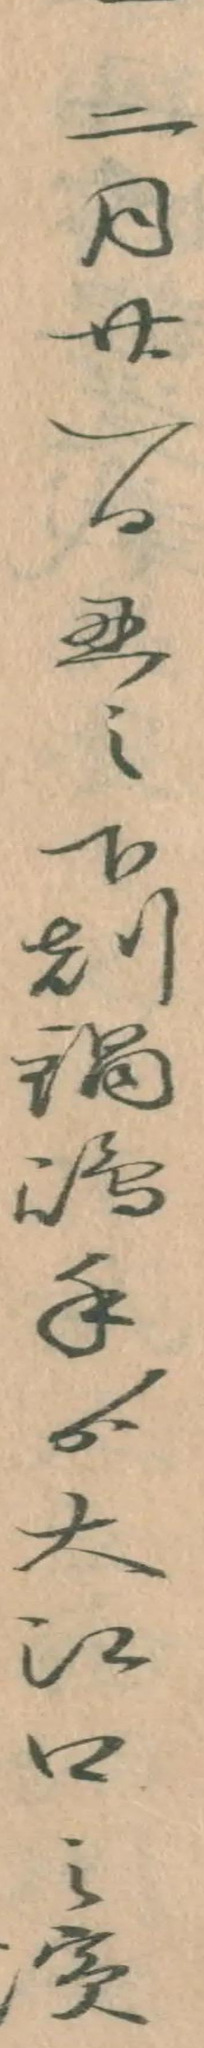一二月廿一日丑之下刻鍋島手ゟ大江口之浜
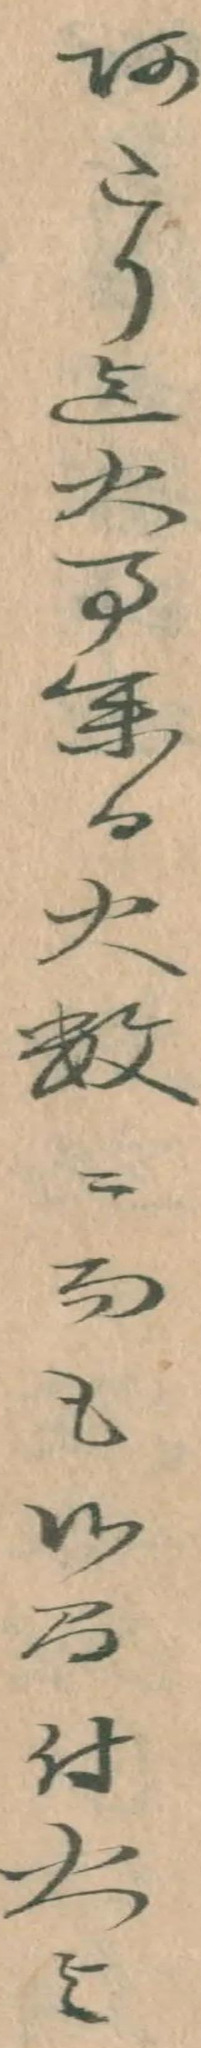阿たり迄火事参る火数に而も候間付火与
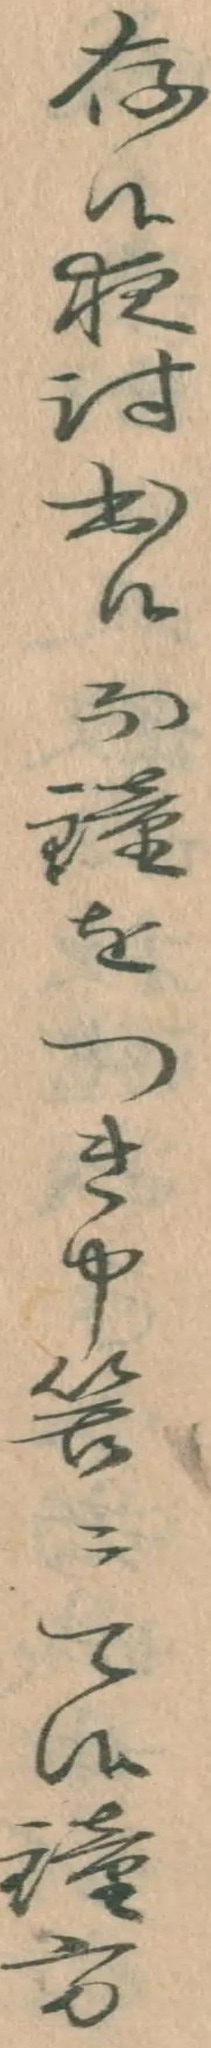存候夜討出候而鐘をつき申筈にて候鐘方
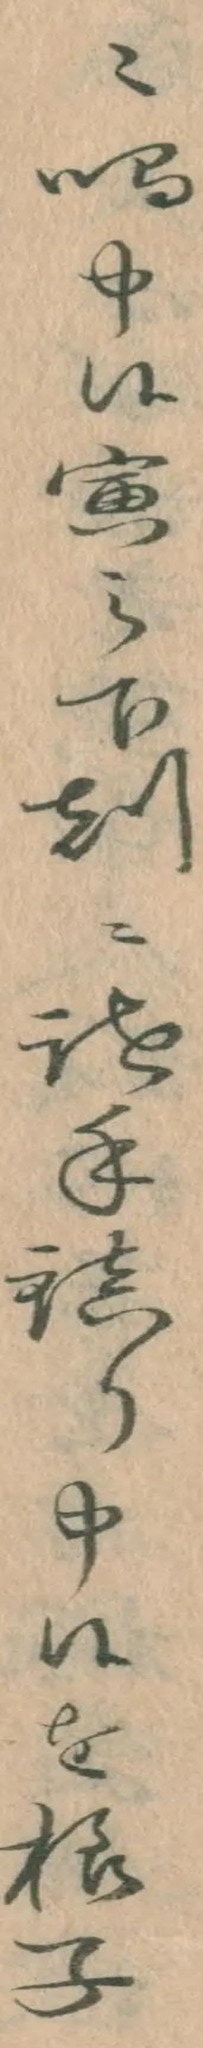に唱申候寅之下刻に諸手鎮り申候を様子
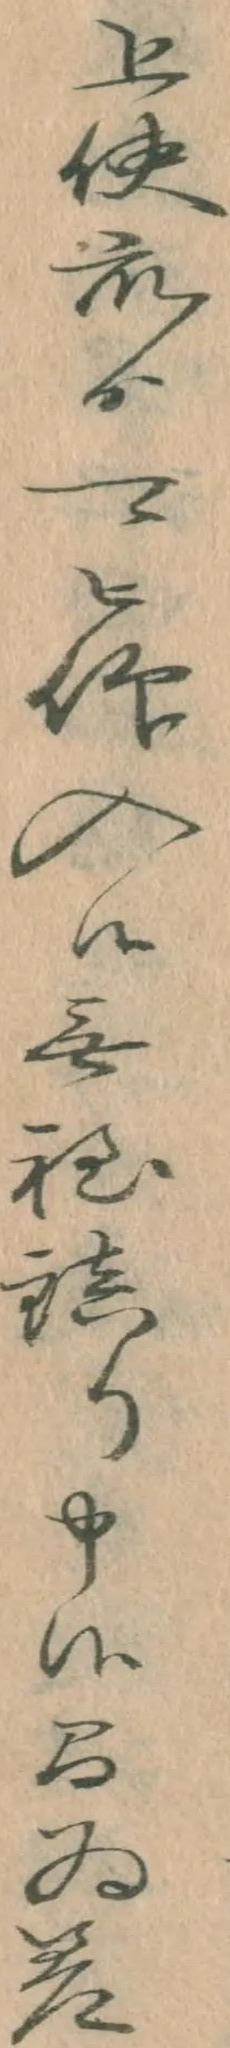上使衆ゟ可被仰入候無程鎮り申候間ゐ差
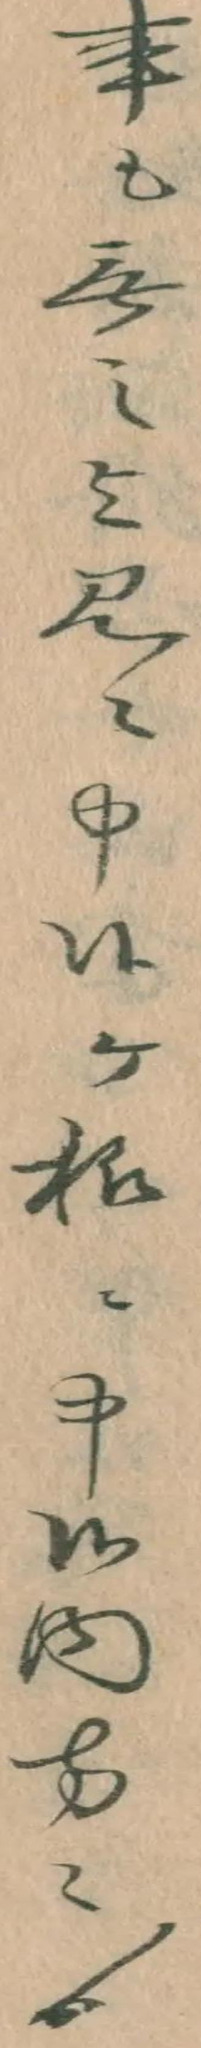事も無之与見に申候け様に申候内方々ゟ
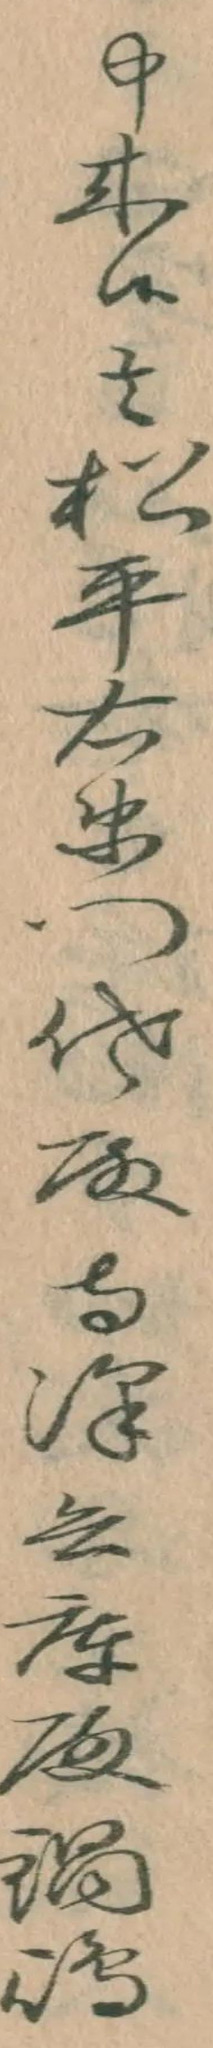申来候者松平右衛門佐殿寺沢兵庫殿鍋島
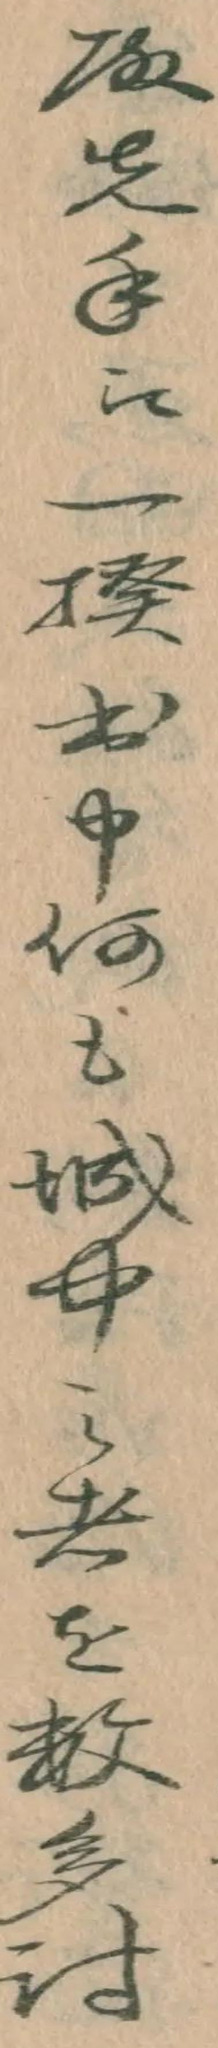殿先手江一揆出申何も城中之者を数多討
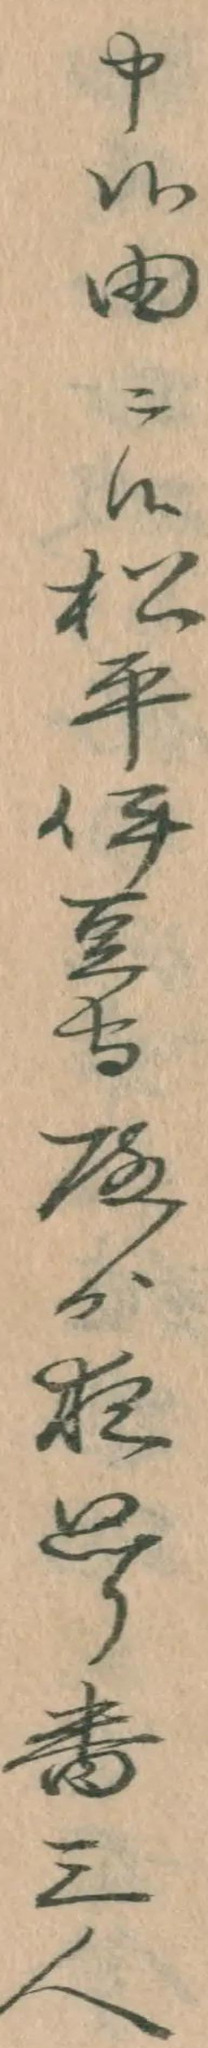申候由に候松平伊豆守殿ゟ夜廻り番三人
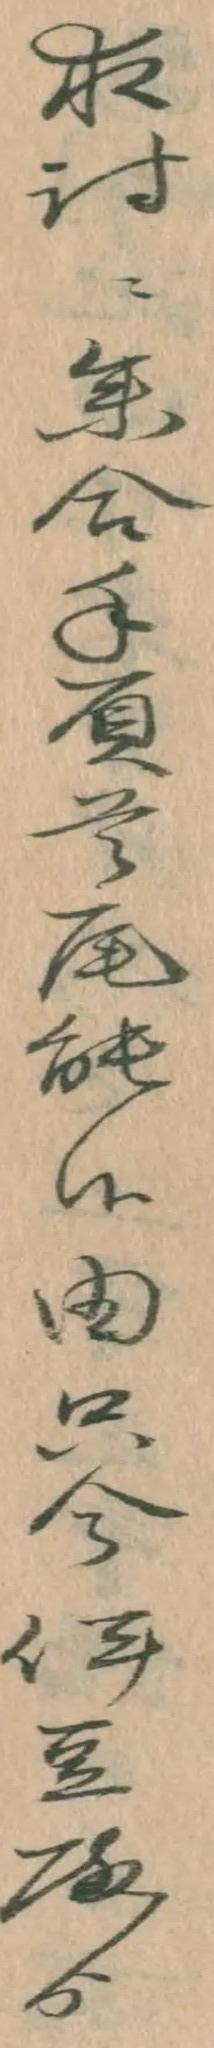夜討に参合手負首尾能候由只今伊豆殿ゟ
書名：切支丹御退治記 49巻. [7]
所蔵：国立国会図書館 National Diet Library, JAPAN
